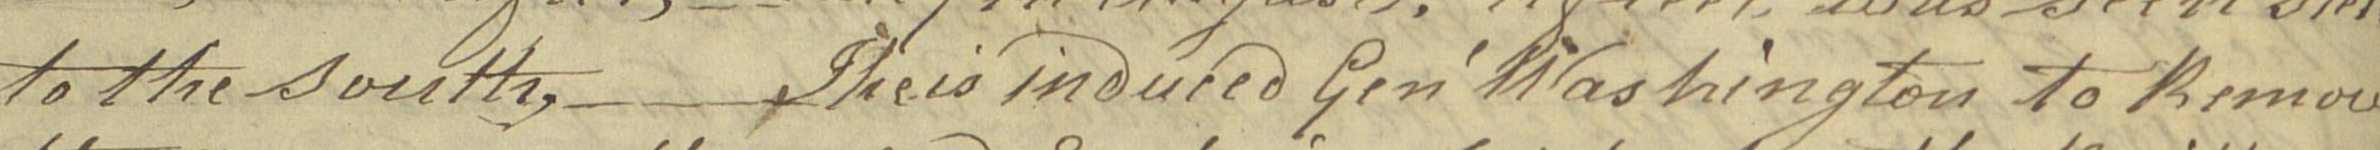to the south, Theis induced Gen^l Washington to Remov-
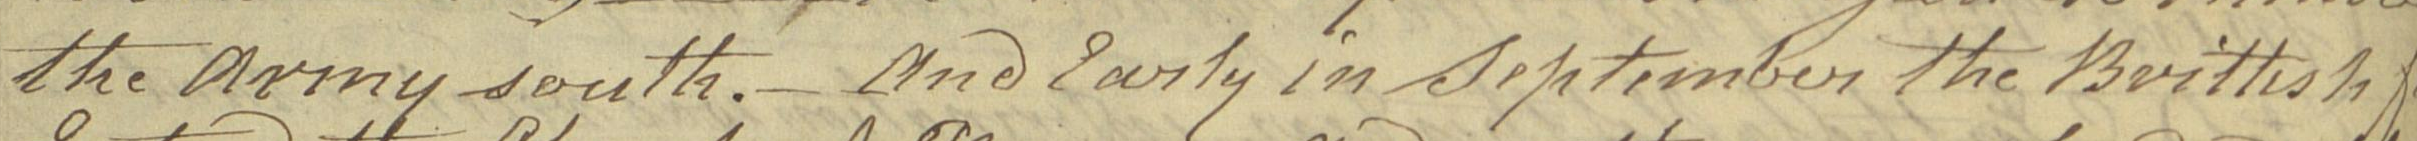the Army south. And Early in September the Brittish
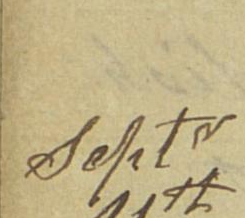Sept^r
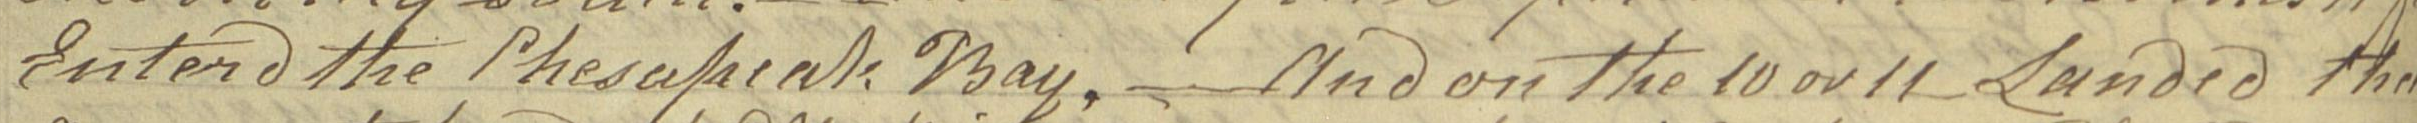Enterd the Chesapeak Bay, And on the 10 or 11 Landed their
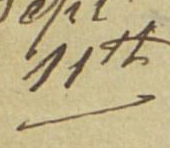11^th
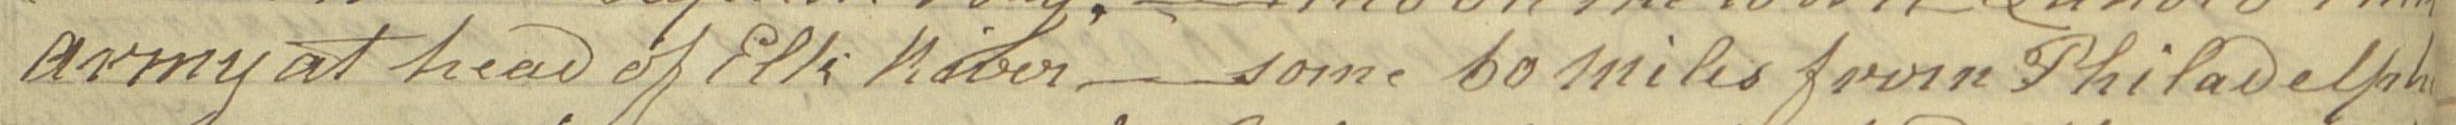Army at head of Elk River. some 60 miles from Philadelph-
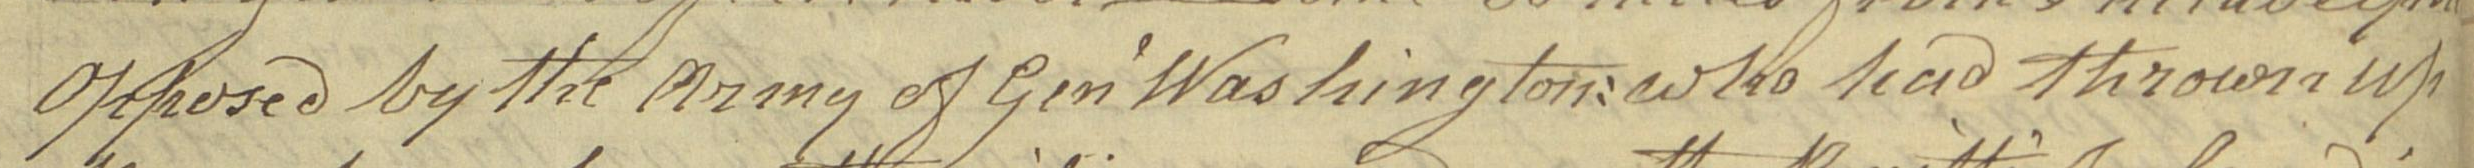Opposed by the Army of Gen^l Washington who had thrown up
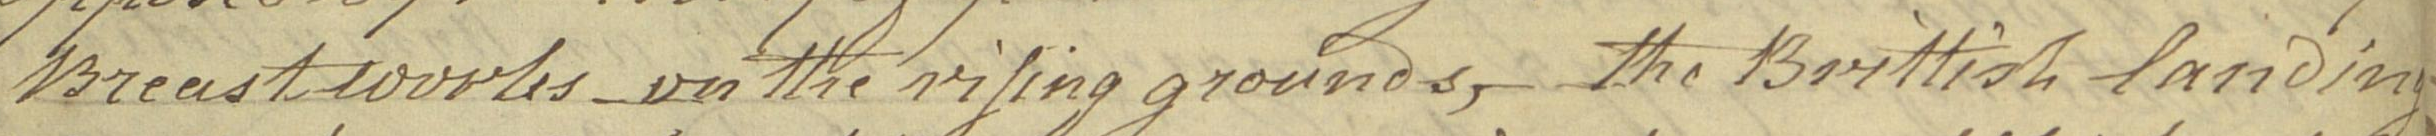Breast works- on the rising grounds, the Brittish Landing
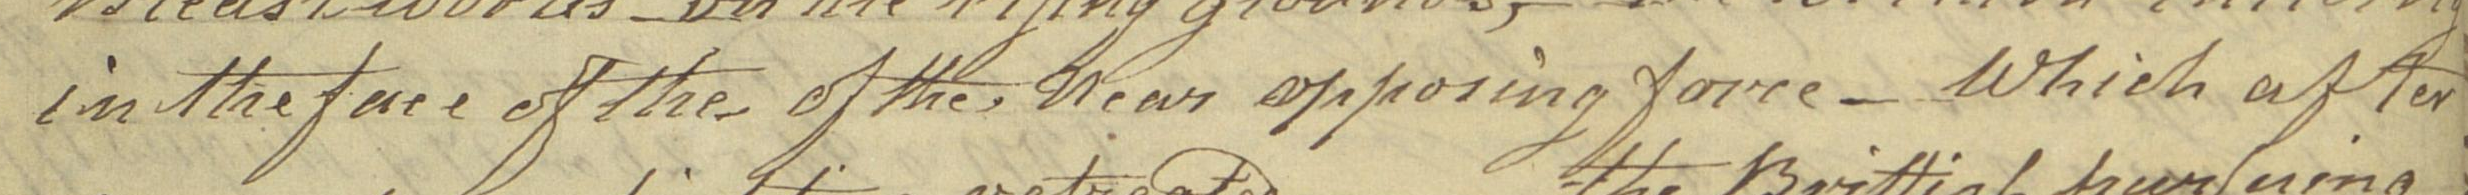in the face of the of the Near opposing force- Which after
